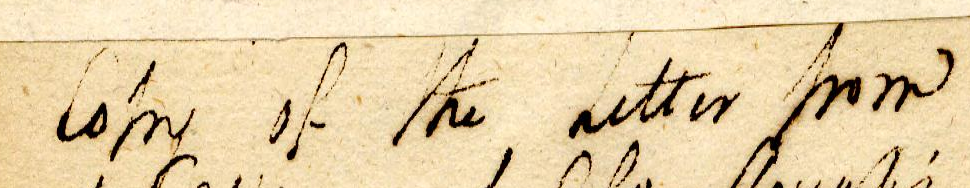Copy of the Letter from
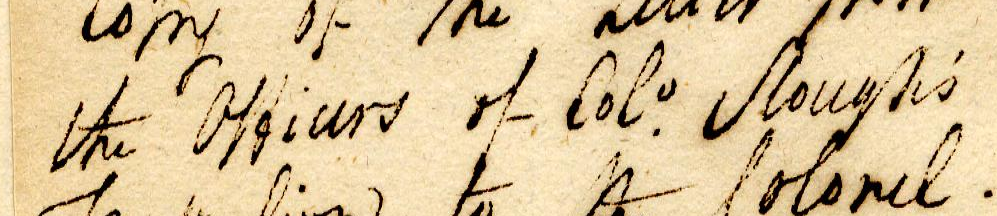the Officers of Col^o Slough's
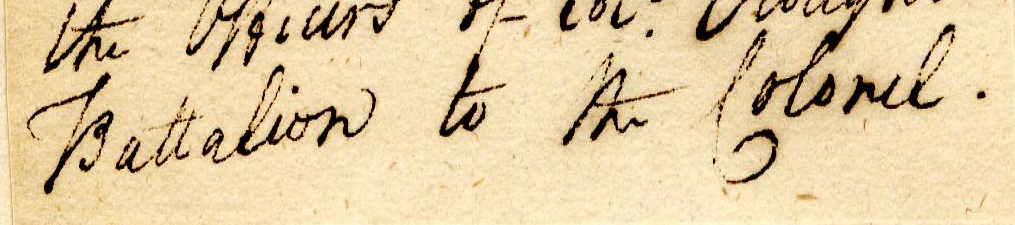Battalion to the Colonel.
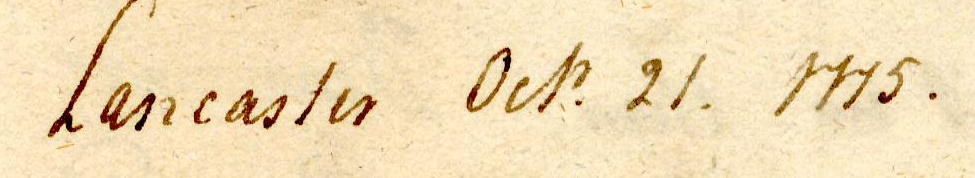Lancaster Oct^r. 21. 1775.
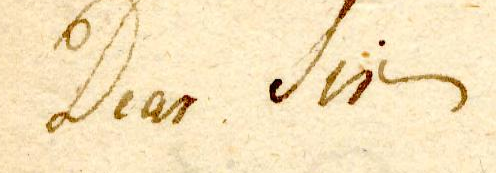Dear Sir
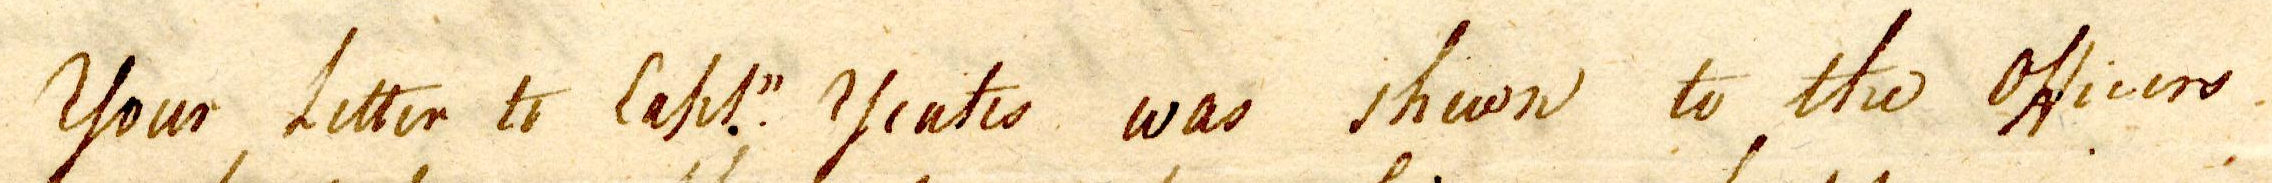Your Letter to Capt^r. Yeates was shewn to the Officers
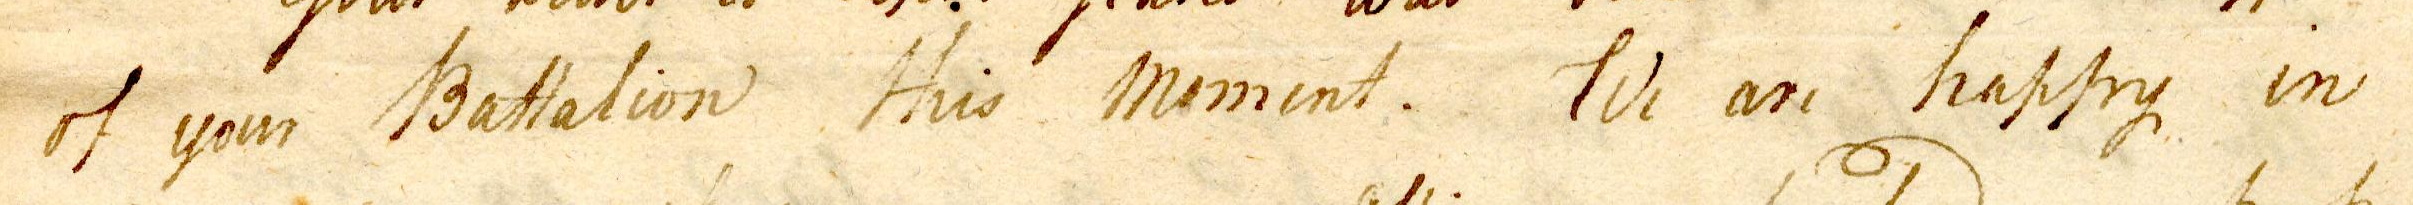of your Battalion this moment. We are happy in
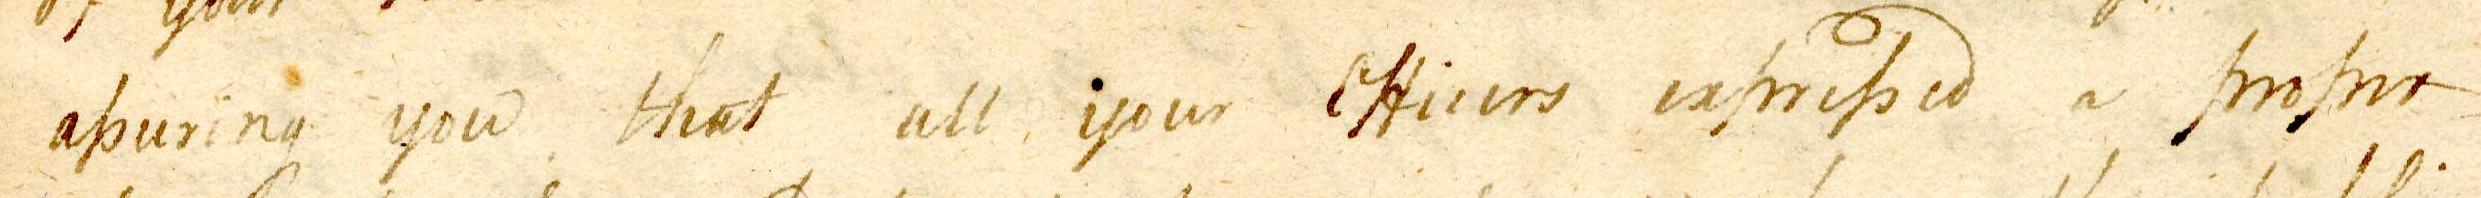assuring you that all your Officers expressed a proper
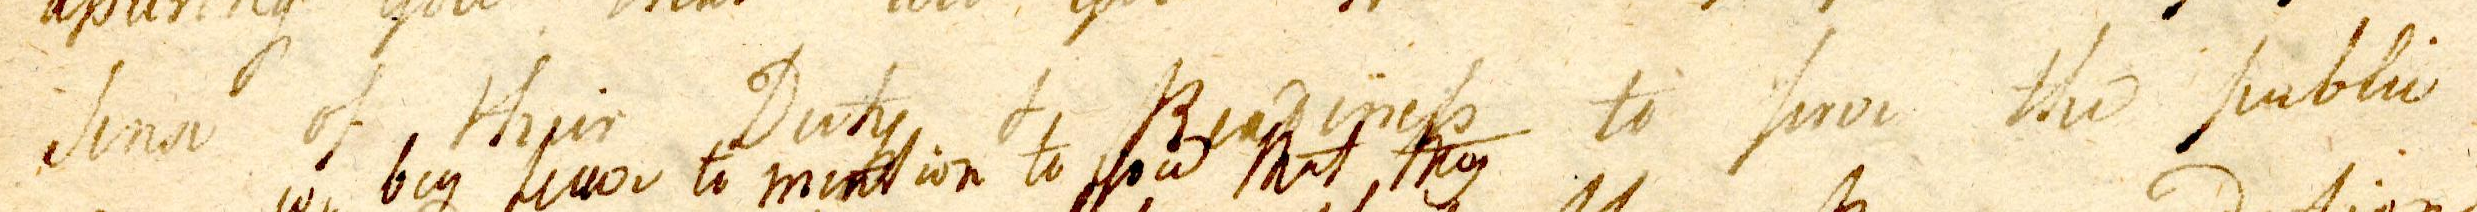Sense of their Duty & Readiness to serve the public
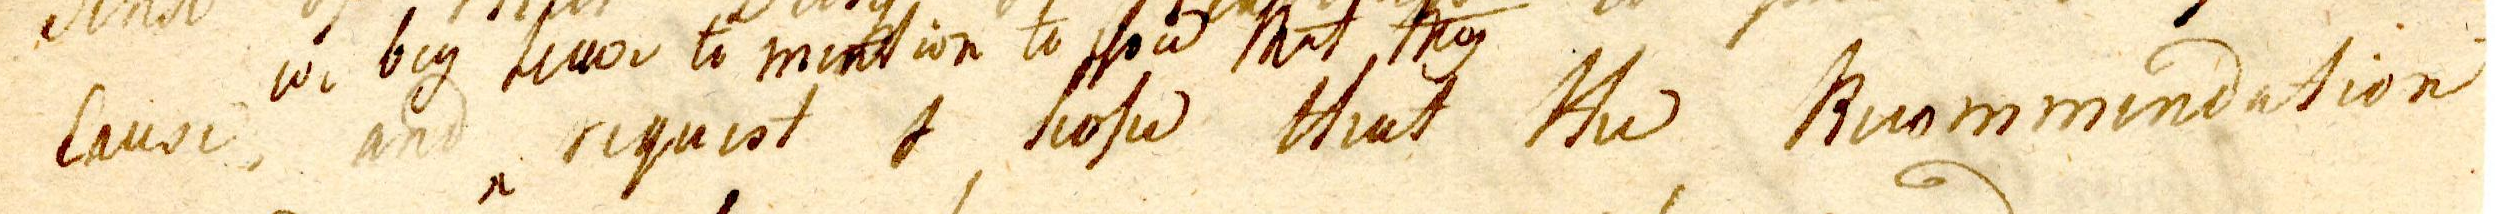Cause, and ^ request & hope that the Recommendation
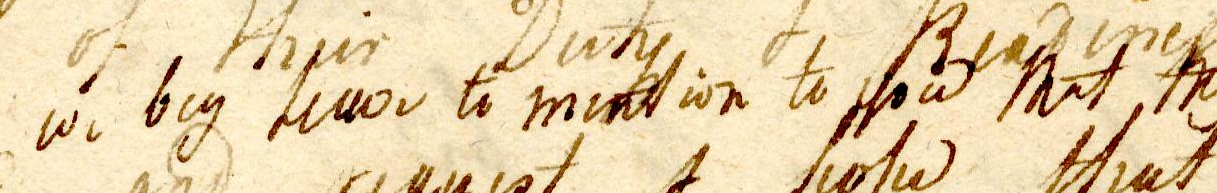we beg Leave to mention to you that they
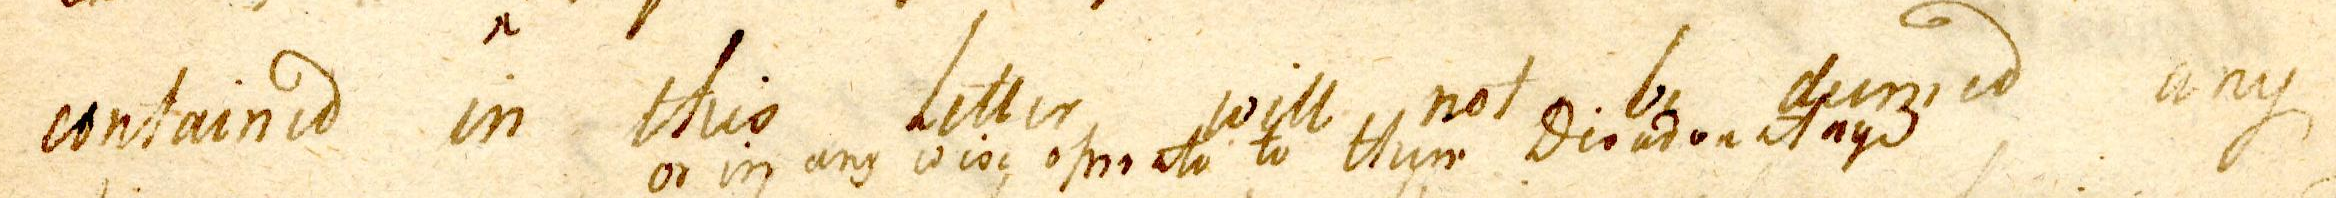contained in this Letter will not be denied any
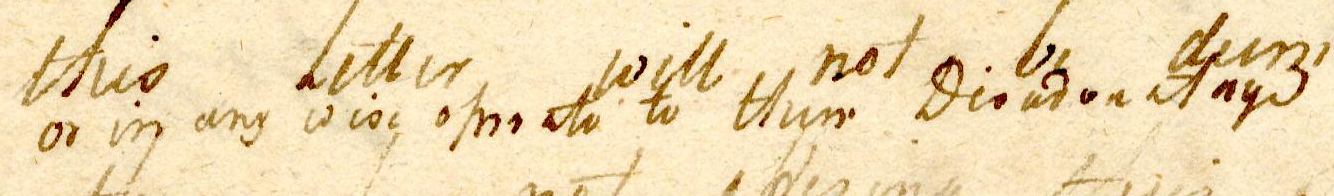or in any wise operate to their Disadvantage
